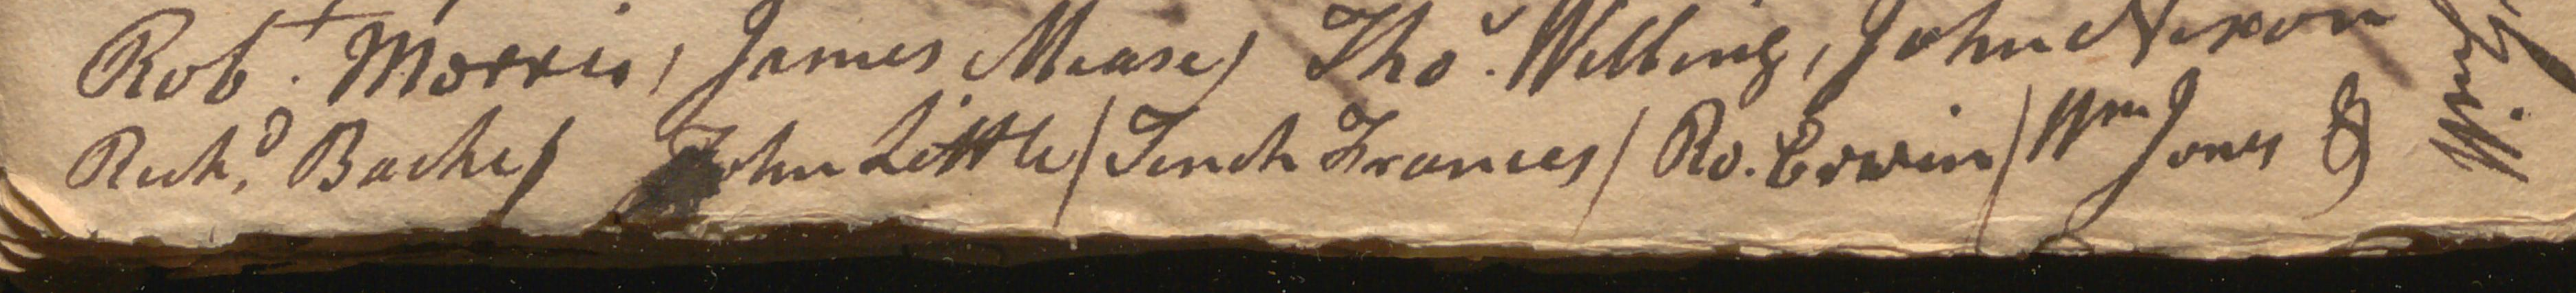Rich^d. Bache, John Little / Tench Frances / Ro. Erwin / W^m Jones &
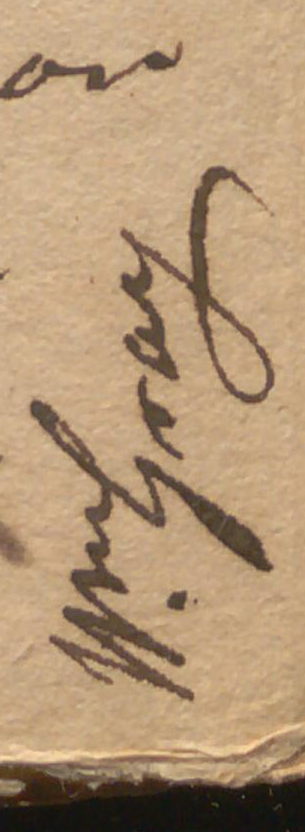W^m. Gray
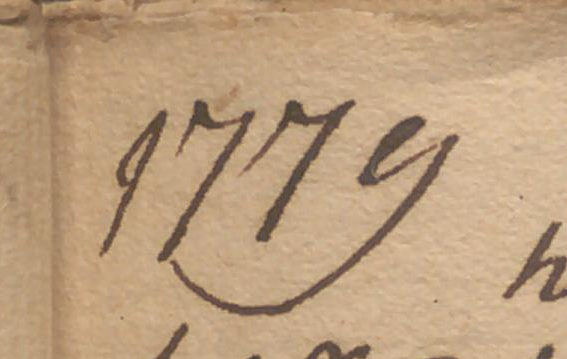1779
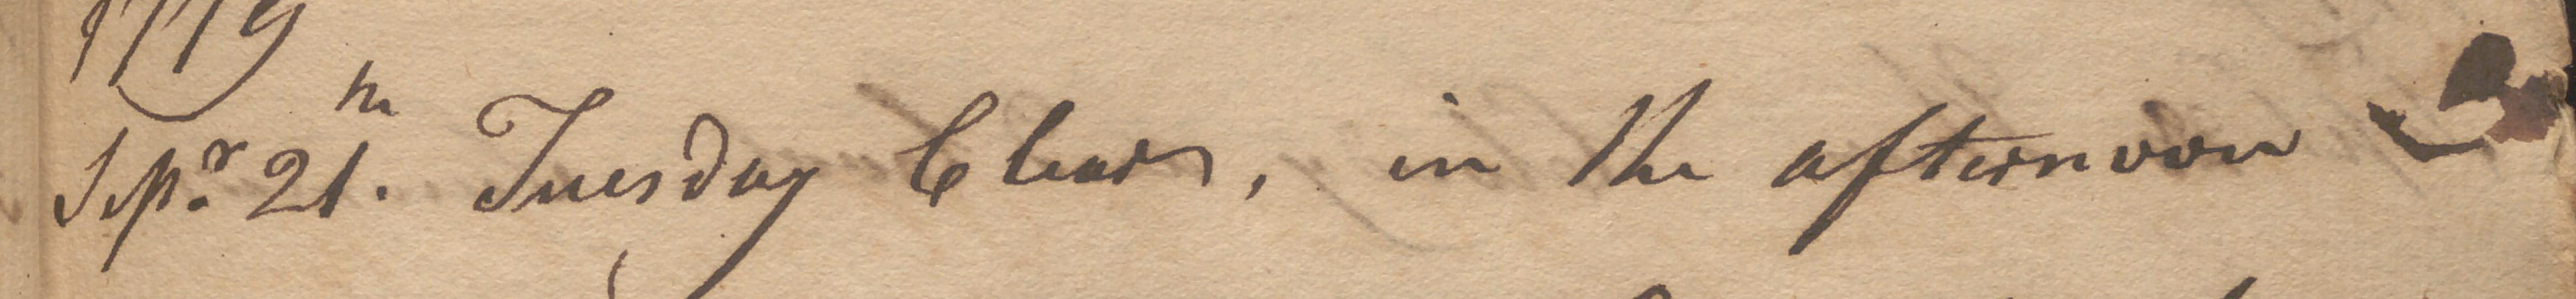Sep^r. 21^th. Tuesday Clear, in the afternoon
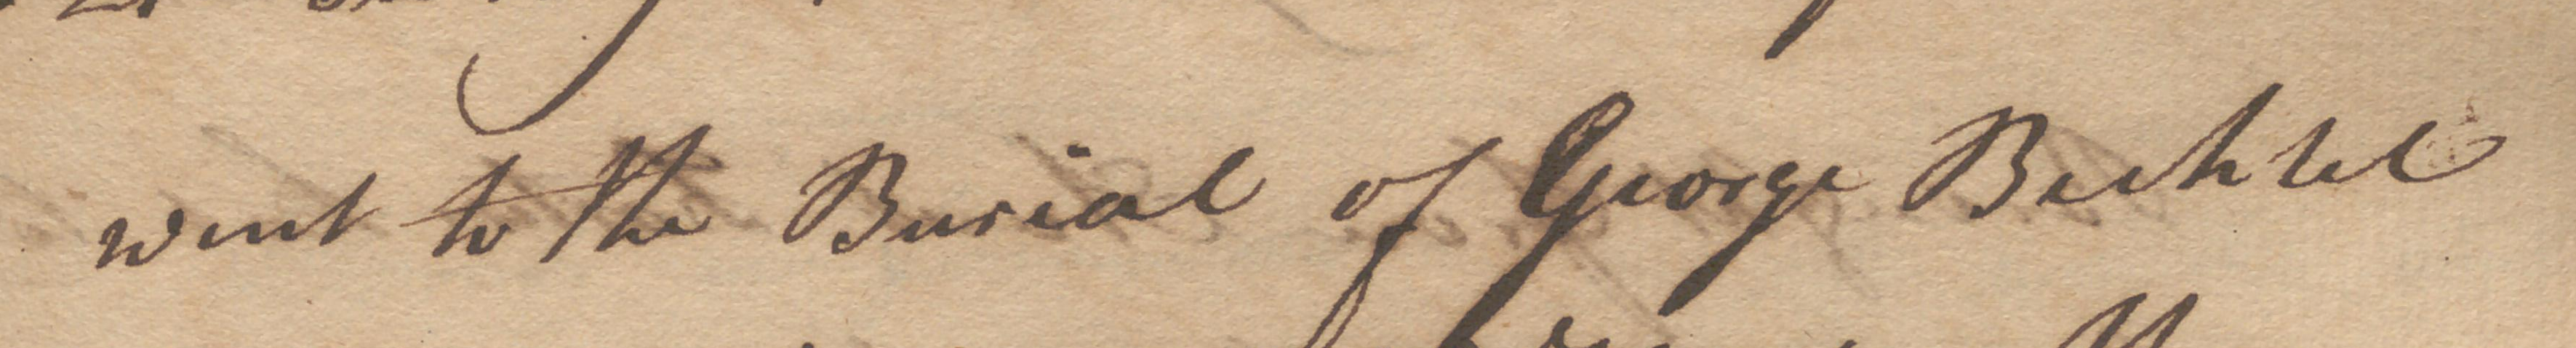went to the Burial of Grorge Bechtel
